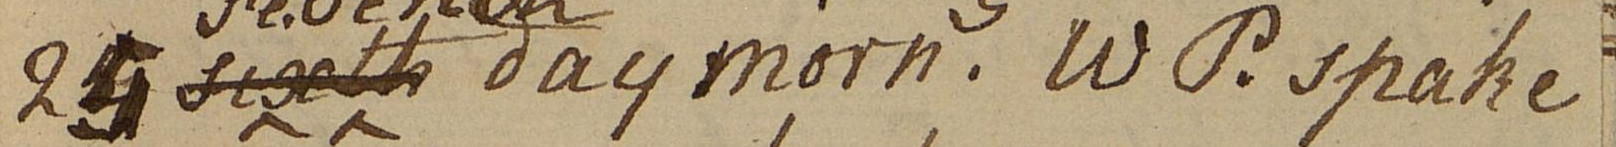24 [sixth] day morn^g. W P. spake
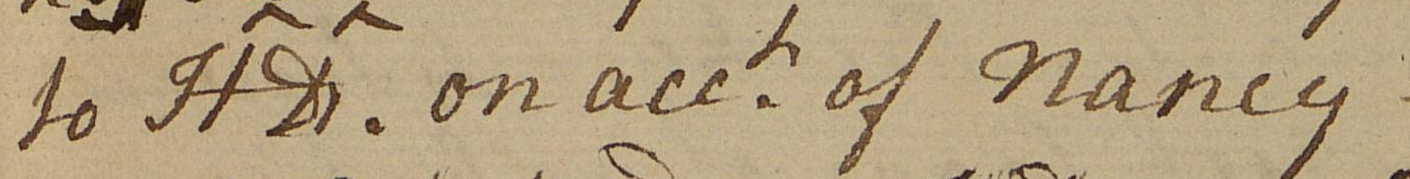to HD. on acc^t. of Nancy
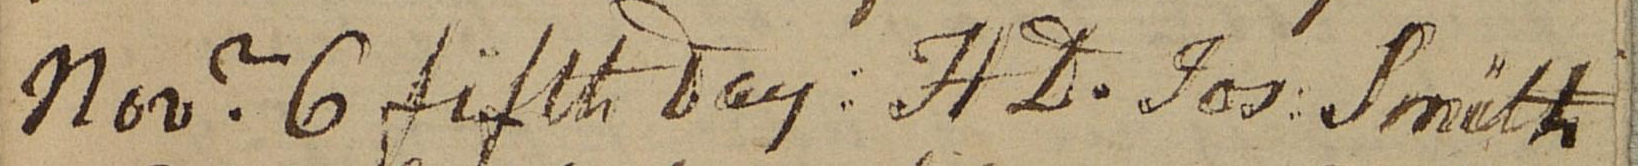Nov^r. 6 fifth day: H D. Jos: Smith
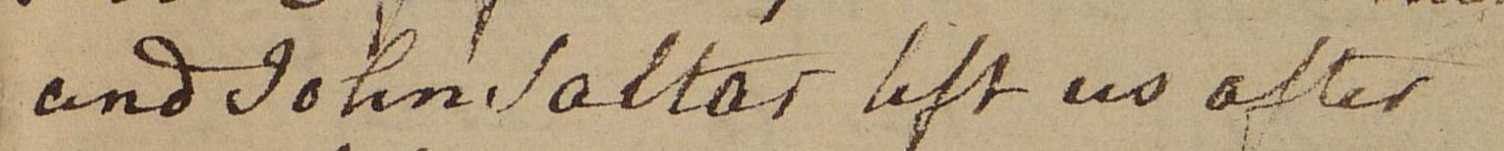and John Saltar left us after
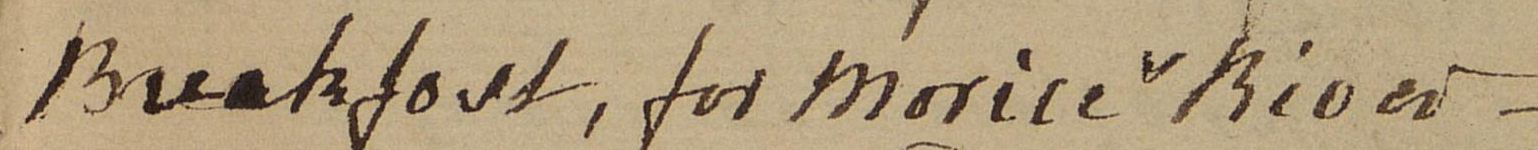Breakfost, for Morice^s River
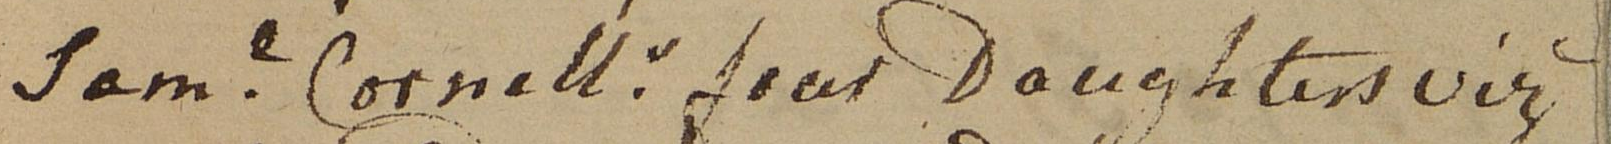Sam^l. Cornell^s. four Daughters viz
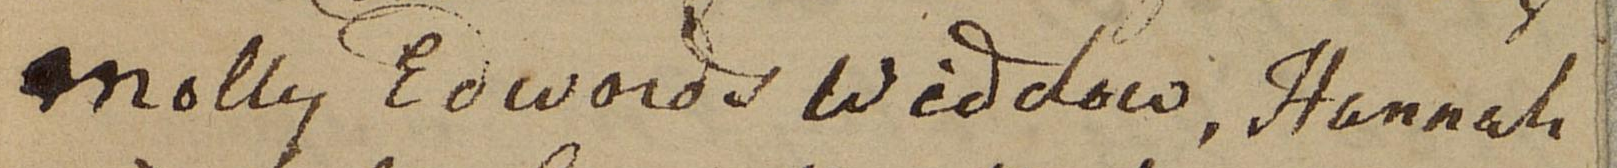Molly Edwards Widdow, Hannah
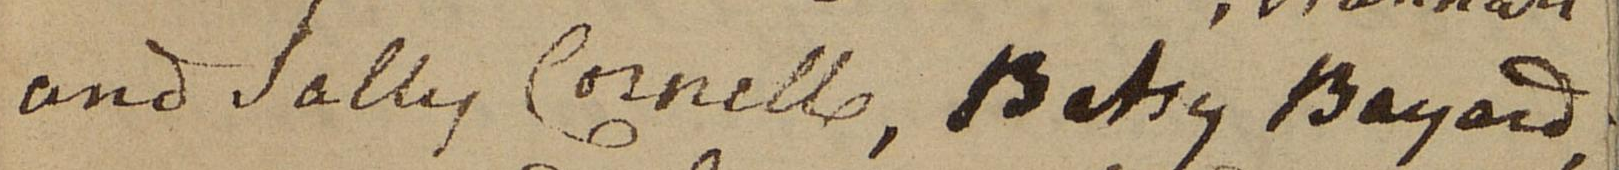and Sally Cornells, Betsy Bayard
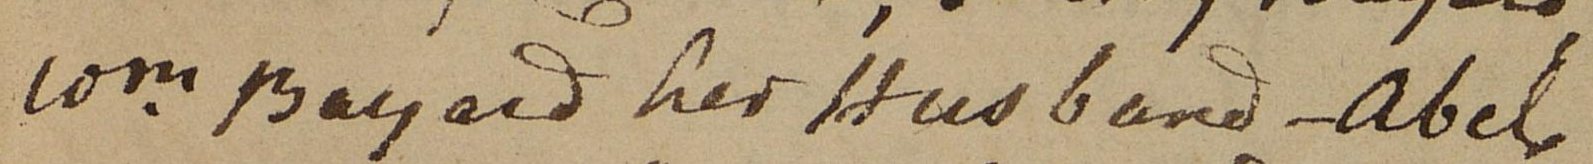W^m. Bayard and her Husband- Abel
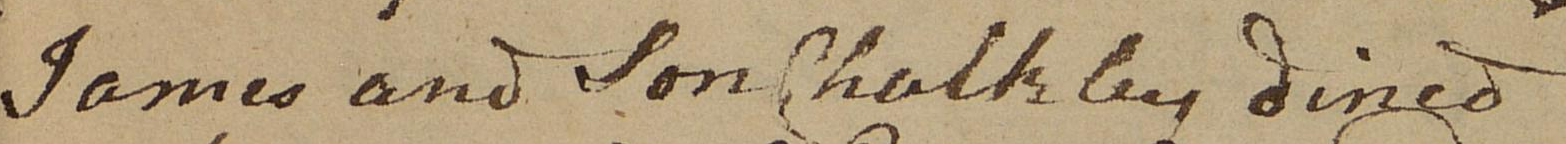James and Son Chalkley dined
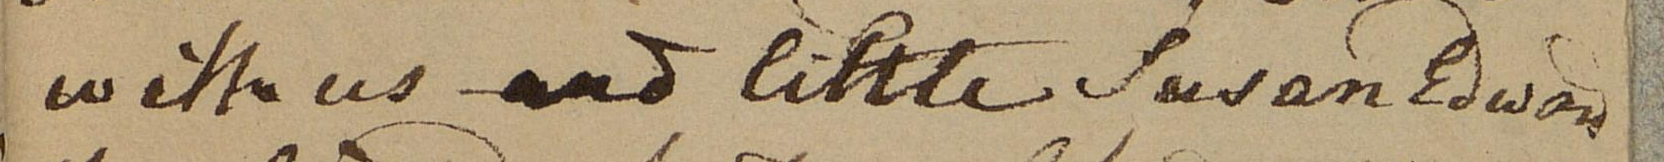with us- and little Susan Edward
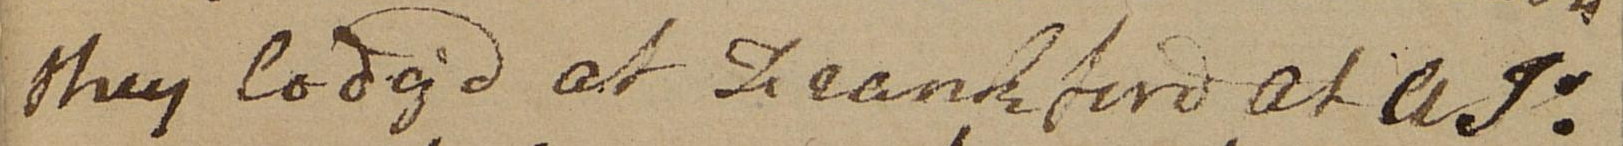they lodg'd at Frankford at A J^s
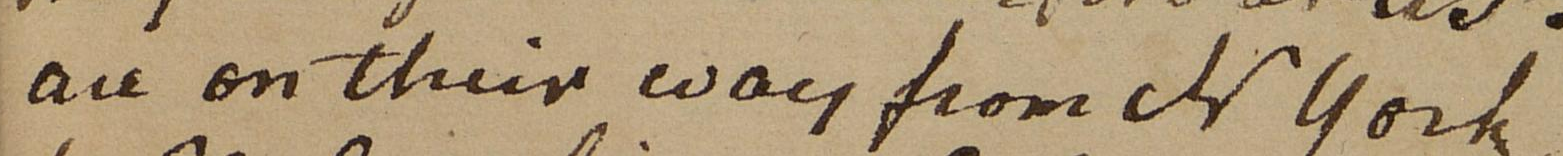are on their way from N York
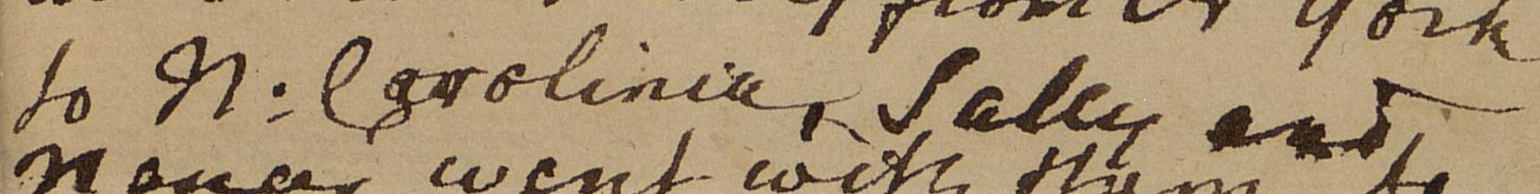to N. Carolinia, Sally and
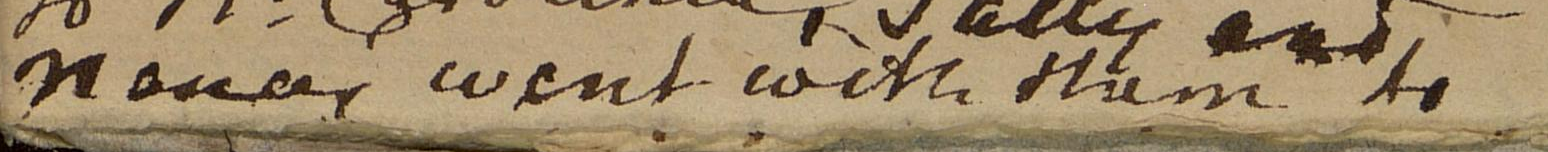Nancy went with them to
